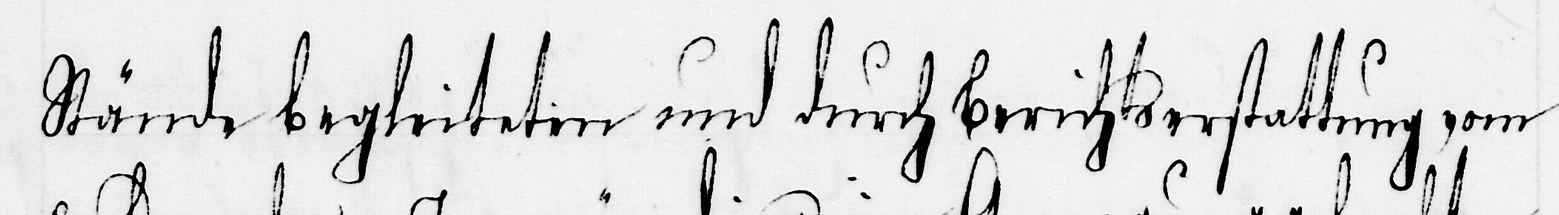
Stände begleiteten und durch Berichtserstattung
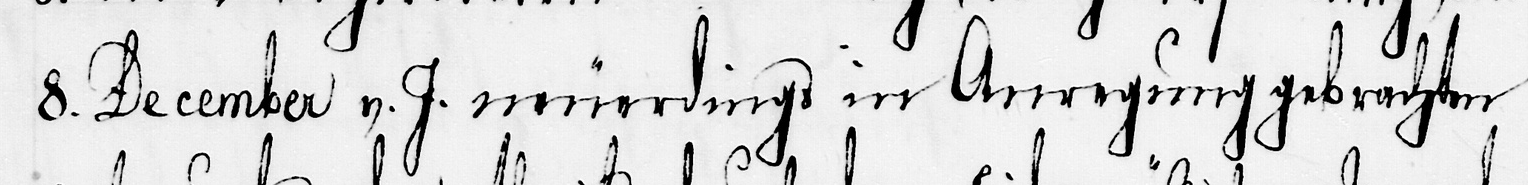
8. December v. J. neuerdings in Anregung gebrachten
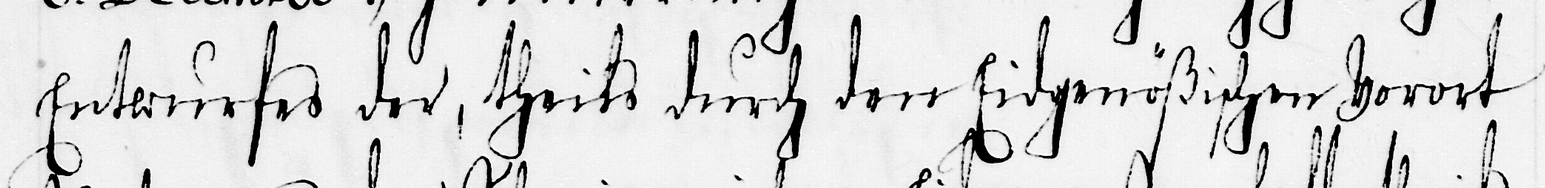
Entwurfes der, theils durch den Eidgenößischen Vorort
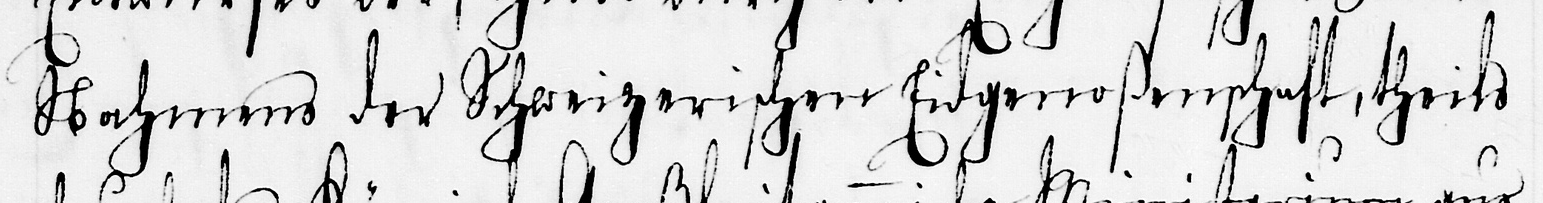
Nahmens der Schweizerischen Eidgenoßenschaft, theils
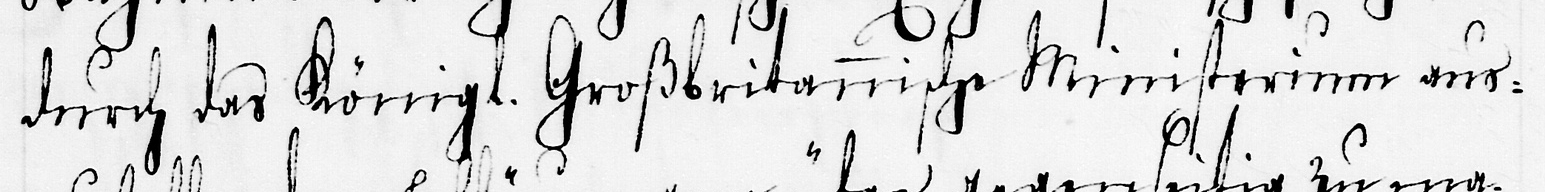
durch das Königl. Großbritannische Ministerium aus¬
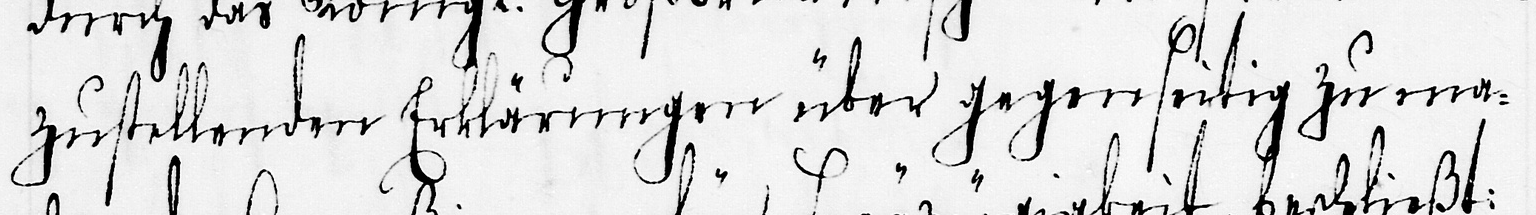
zustellenden Erklärungen über gegenseitig zu ma¬
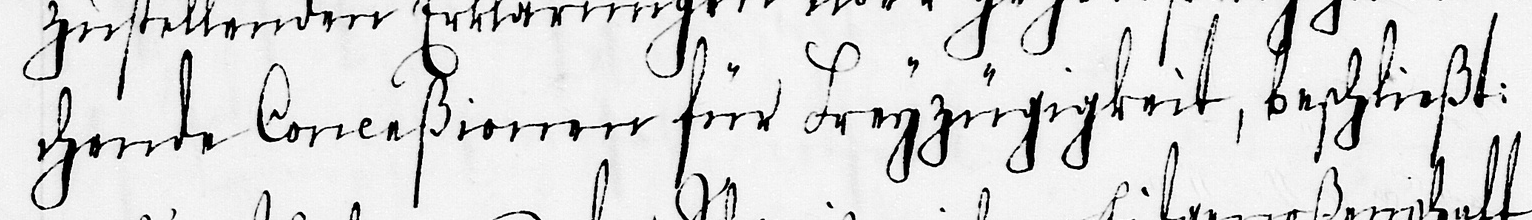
chende Conceßionen für Freyzügigkeit, beschließt:
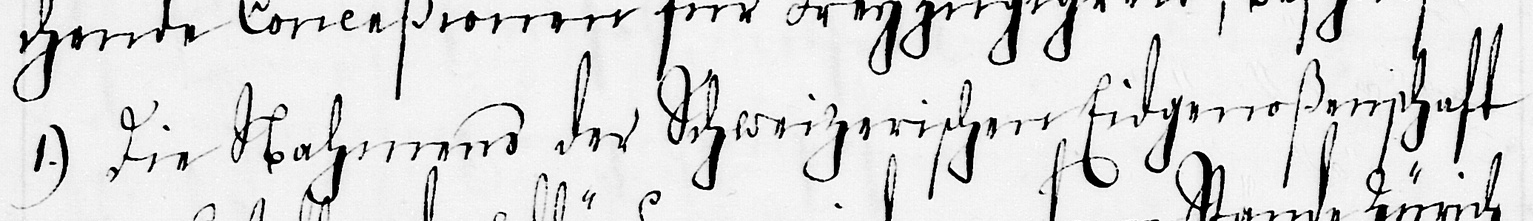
1.) Die Nahmens der Schweizerischen Eidgenoßenschaft
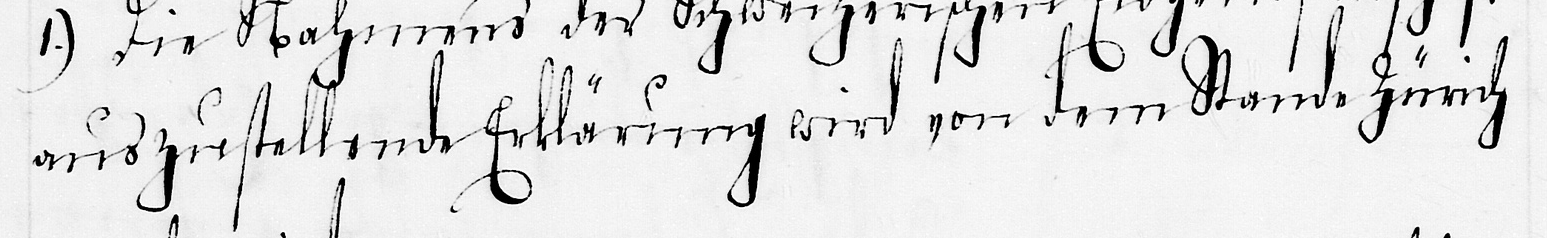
auszustellende Erklärung wird von dem Stande Zürich
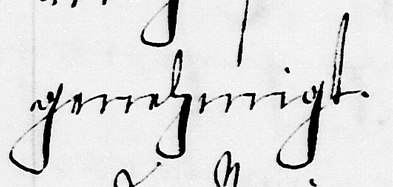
genehmigt.
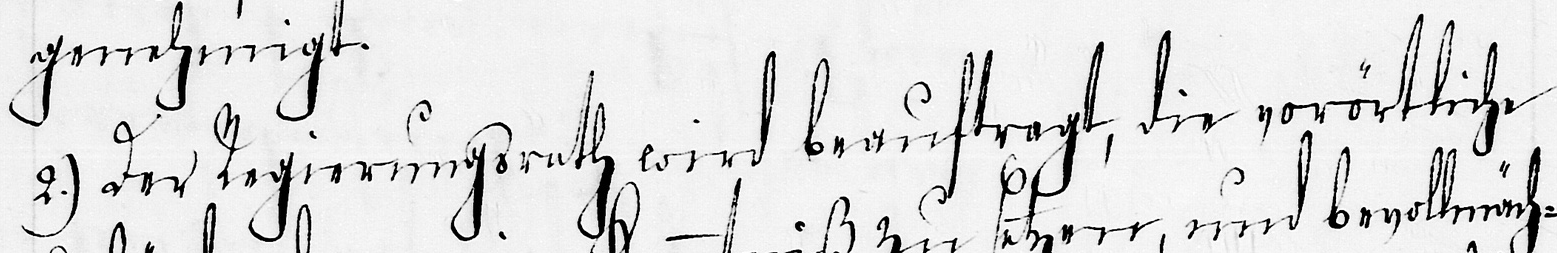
2.) Der Regierungsrath wird beauftragt, die vorörtliche
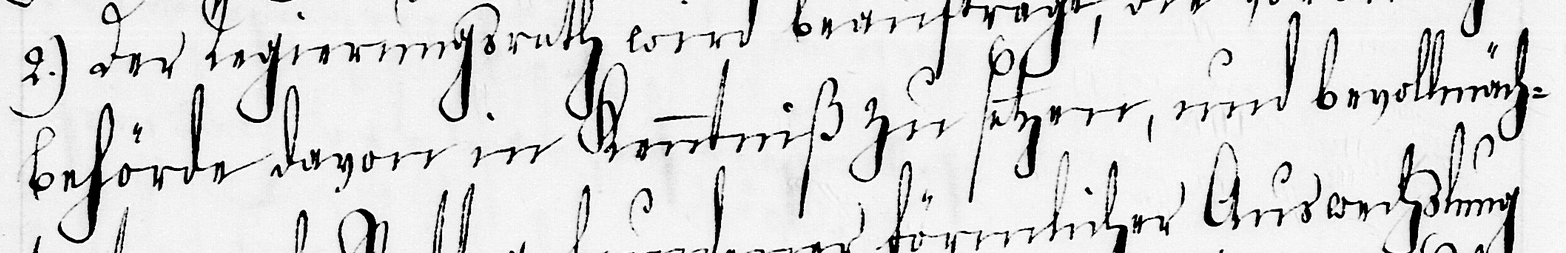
Behörde davon in Kenntniß zu setzen, und bevollmäch¬
